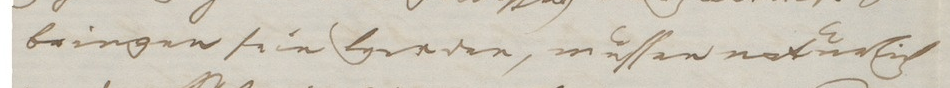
bringen sein werden, müssen natürlich
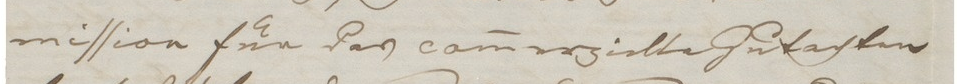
mission für das commerzielle Gutachten
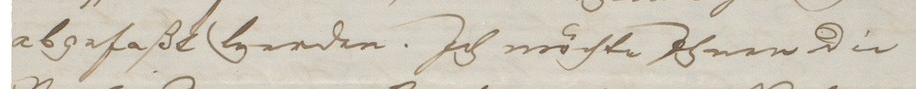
abgefaßt werden. Ich möchte Ihnen die
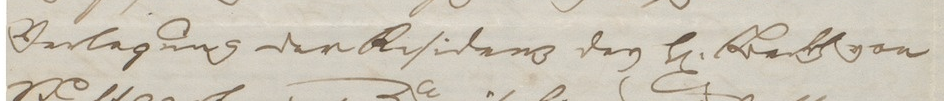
Verlegung der Residenz des H. Beckh von
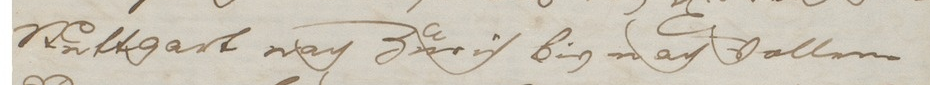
Stuttgart nach Zürich hin nach Vollen-
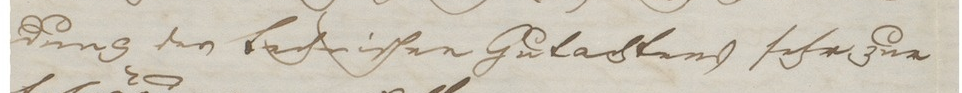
dung des technischen Gutachtens sehr zur
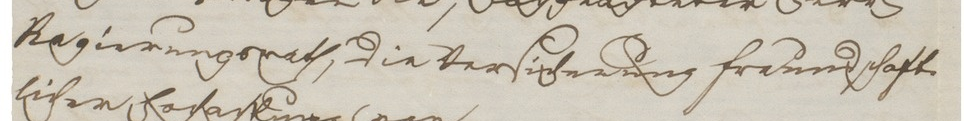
Regierungsrath, die Versicherung freundschaft-
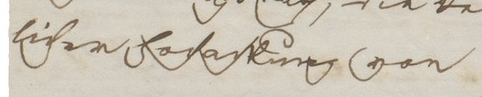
licher Hochachtung von
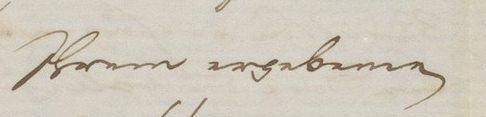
Ihrem ergebenen
